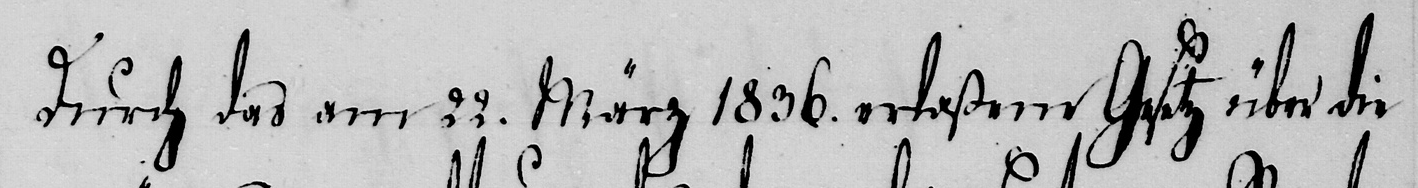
Durch das am 22. März 1836. erlaßene Gesetz über die
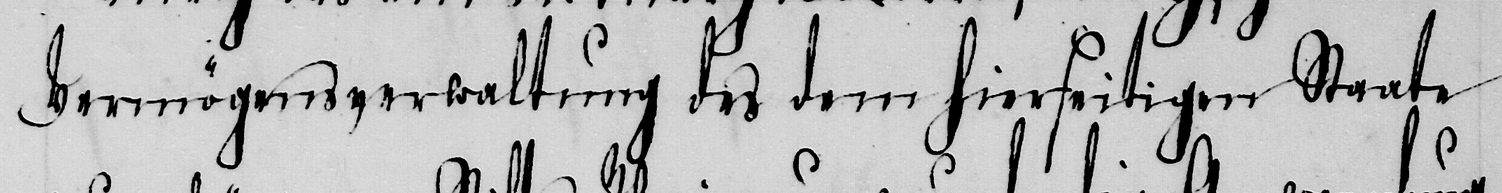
Vermögensverwaltung des dem hierseitigen Staate
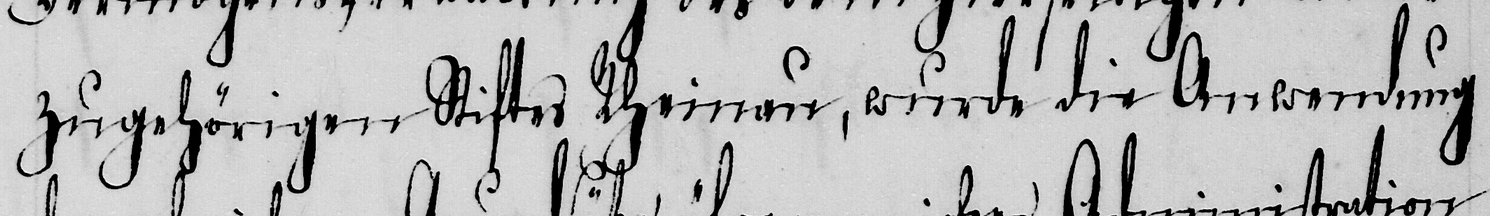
zugehörigen Stiftes Rheinau, wurde die Anwendung
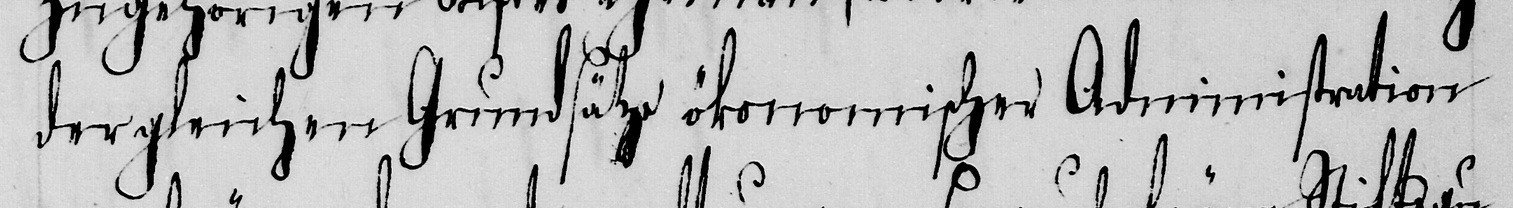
der gleichen Grundsätze ökonomischer Administration
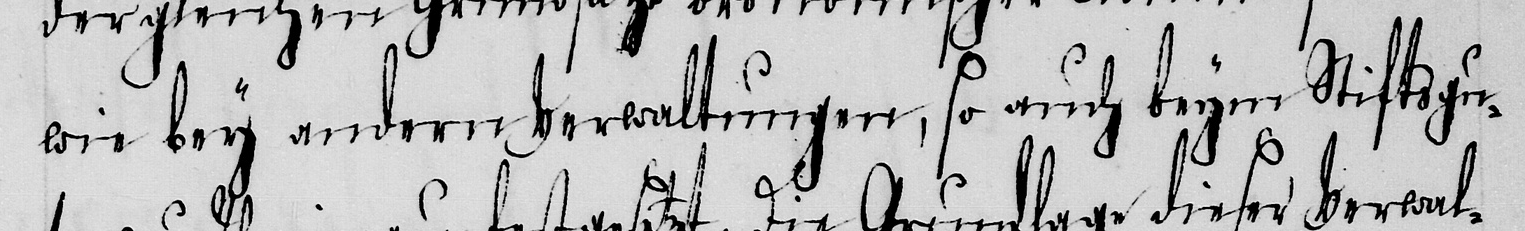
wie bey andern Verwaltungen, so auch beym Stiftsgu¬
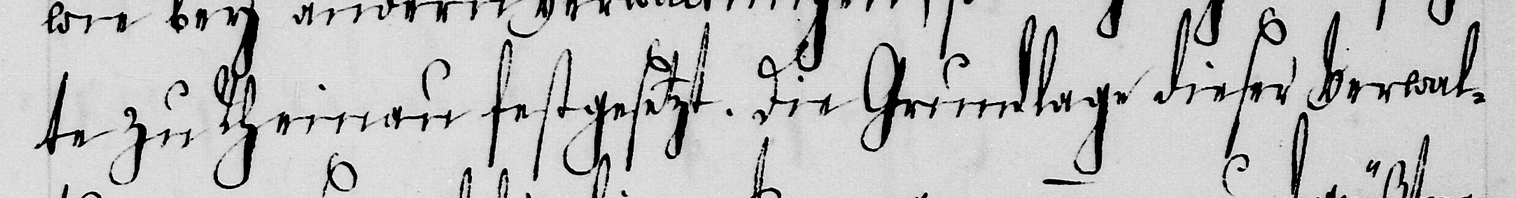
te zu Rheinau festgesetzt. Die Grundlage dieser Verwal¬
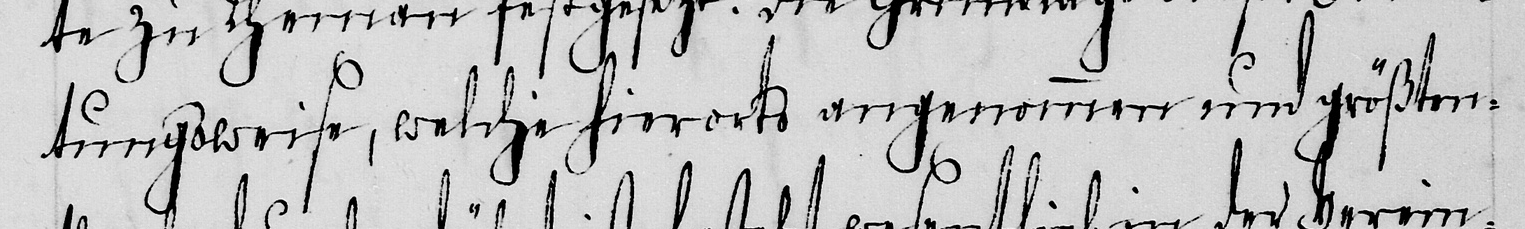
tungsweise, welche hierorts angenommen und größten¬
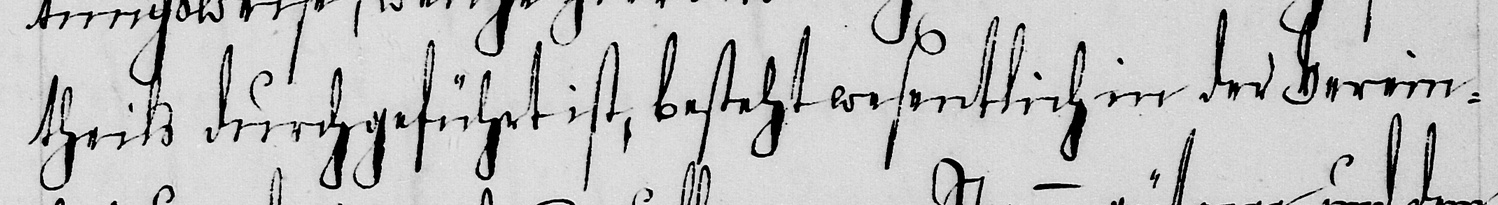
theils durchgeführt ist, besteht wesentlich in der Verein¬
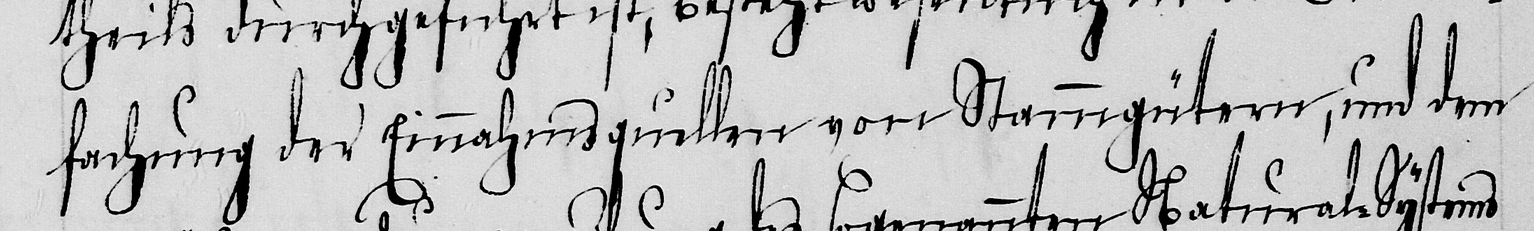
fachung der Einnahmsquellen von Stammgütern, und dem
